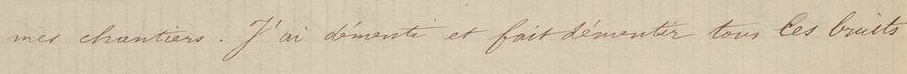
mes chantiers. J'ai démenti et fait démentir tous les bruits
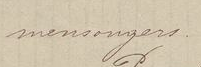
mensongers.
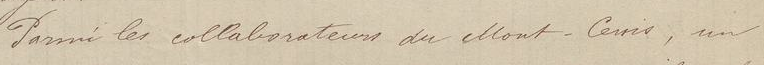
Parmi les collaborateurs du Mont–Cenis, un
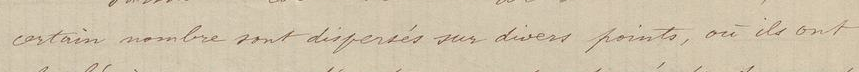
certain nombre sont dispersés sur divers points, où ils ont
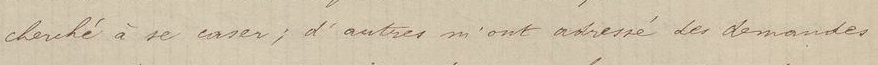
cherché à se caser; d'autres m`ont adressé des demandes
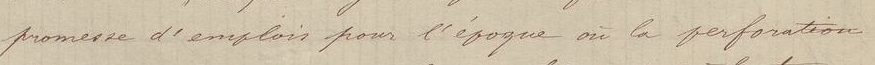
promesse d'emplois pour l'époque où la perforation
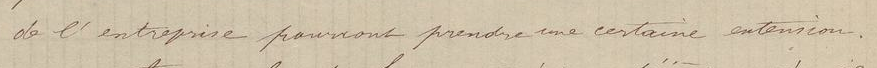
de l`entreprise pourront prendre une certaine extension.
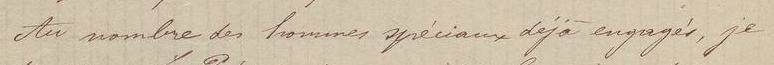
Au nombre des hommes spéciaux déjà engagés, je
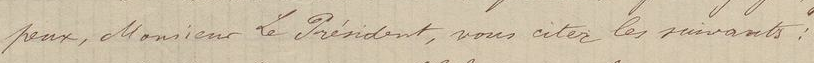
peux, Monsieur Le Président, vous citer les suivants:
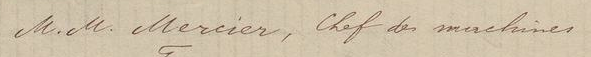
M.M. Mercier, Chef des machines
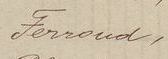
Ferroud,
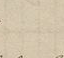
idem
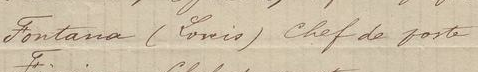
Fontana (Louis) Chef de poste
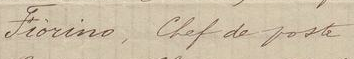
Fiorino, Chef de poste
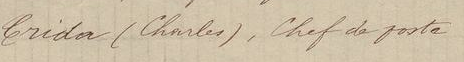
Crida (Charles), Chef de poste
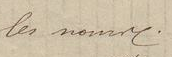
les noms.
